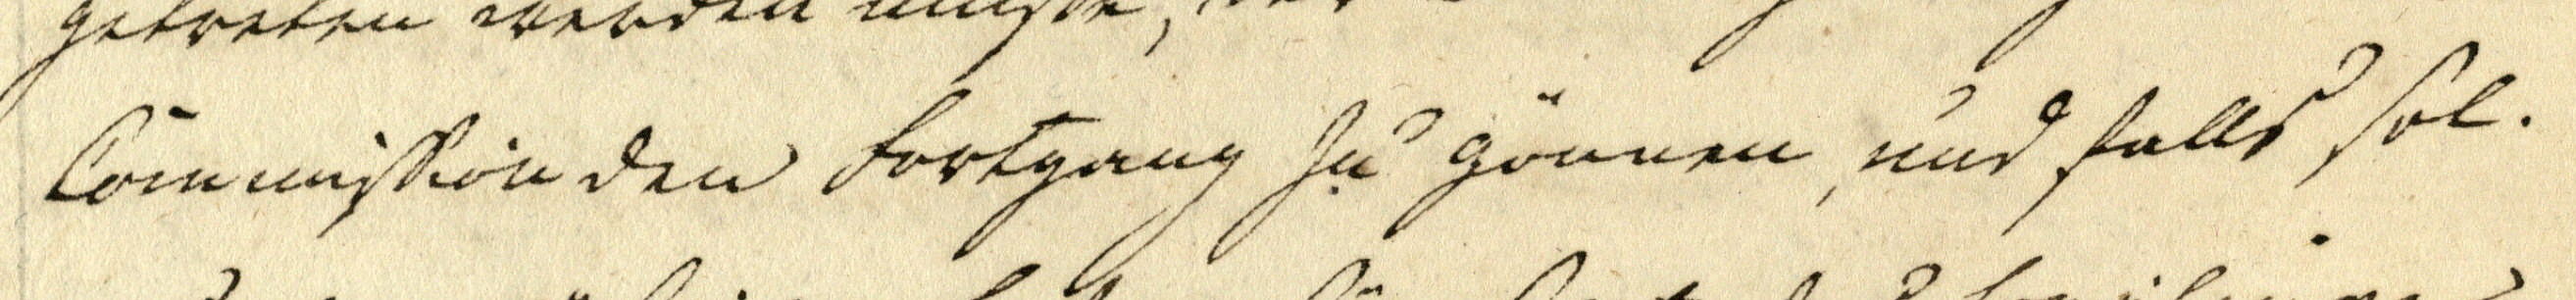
Commission den Fortgang zu gönnen, und falls sol¬
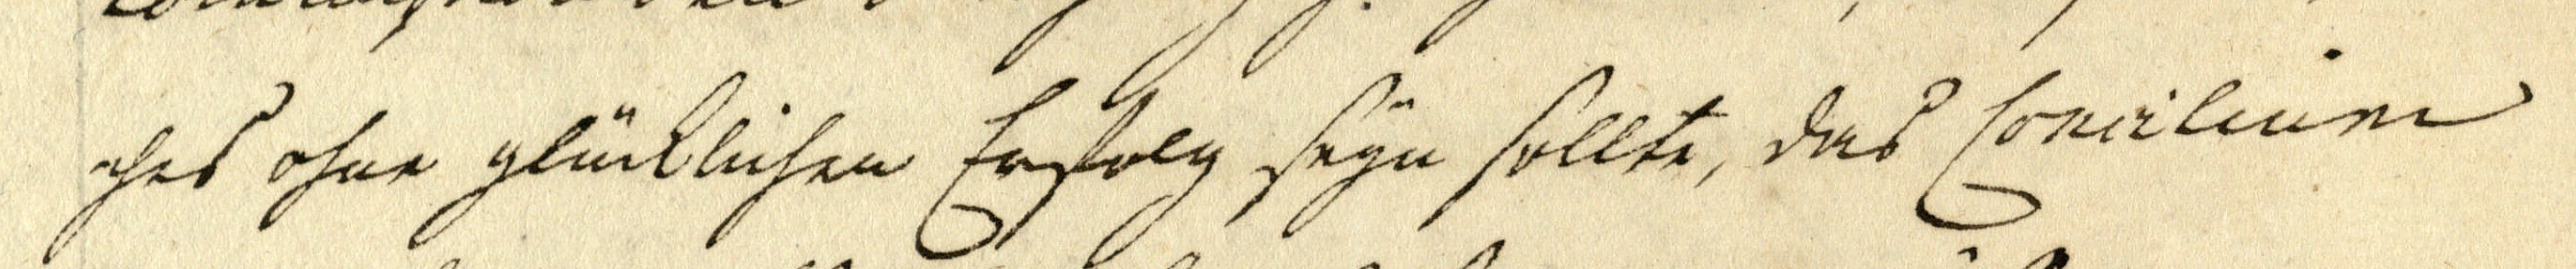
ches ohne glücklichen Erfolg seÿn sollte, das Concilium
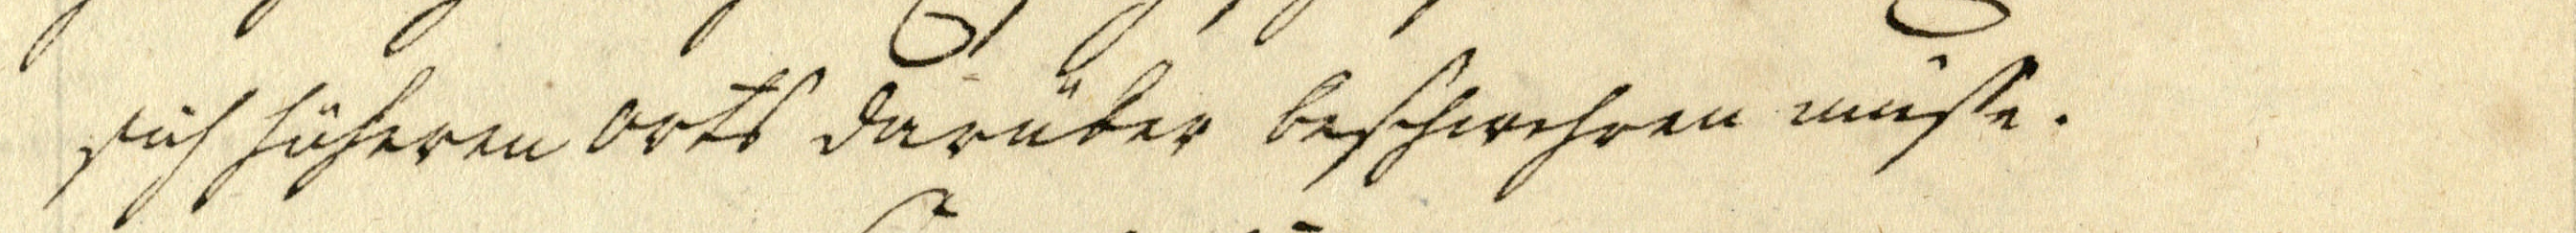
sich höheren orts darüber beschwehren müsse.
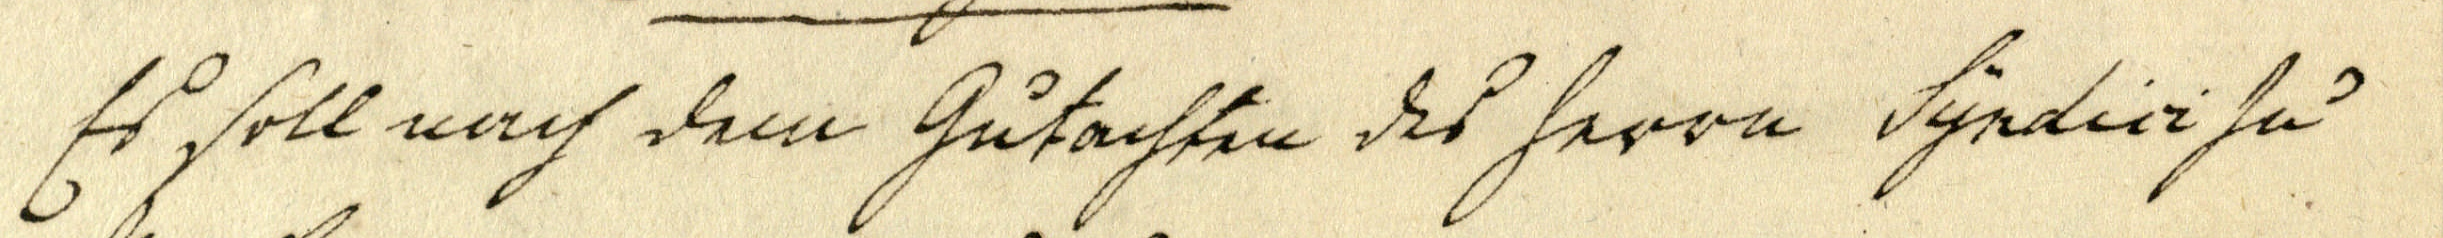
Es soll nach dem Gutachten des herrn Sÿndici zu
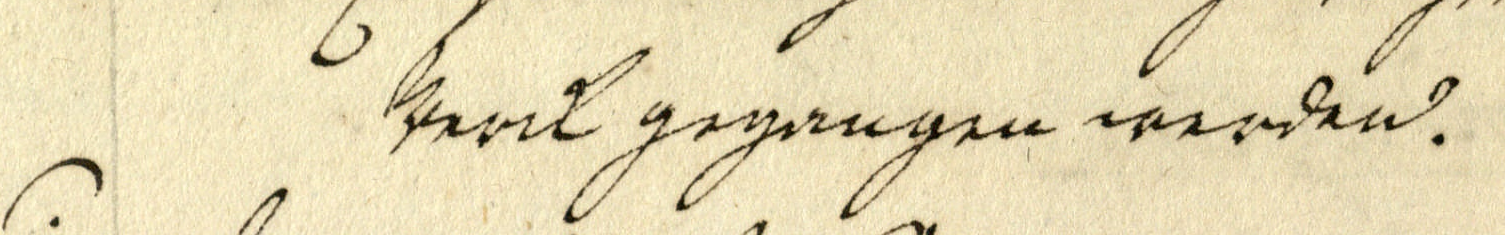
Werck gegangen werden.
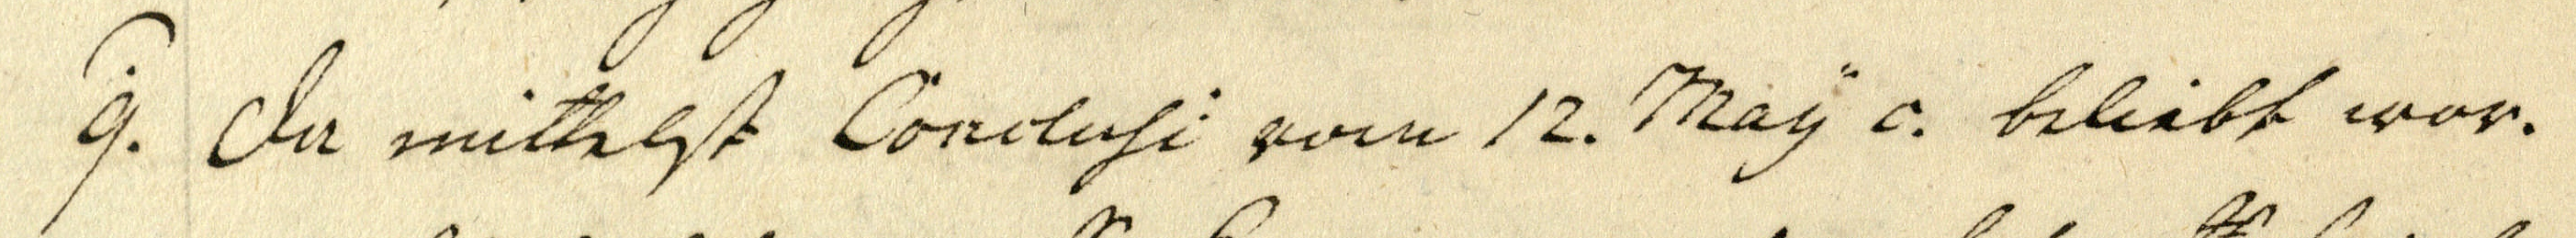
9. Da mittelst Conclusi vom 12. Maÿ c. beliebt wor¬
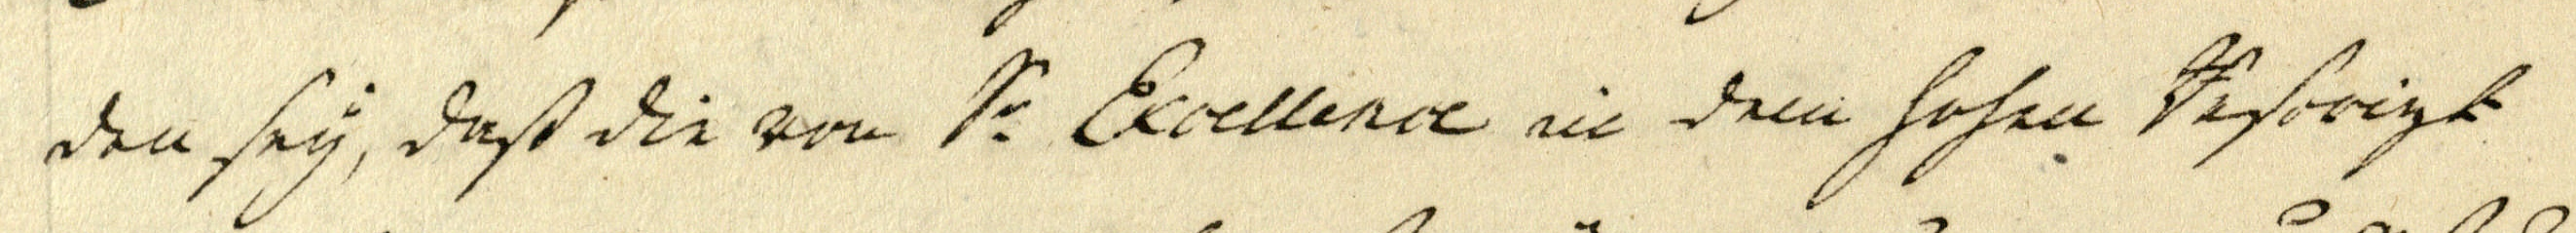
den seÿ, daß die von Sr.Excellence in dem hohen Rescript
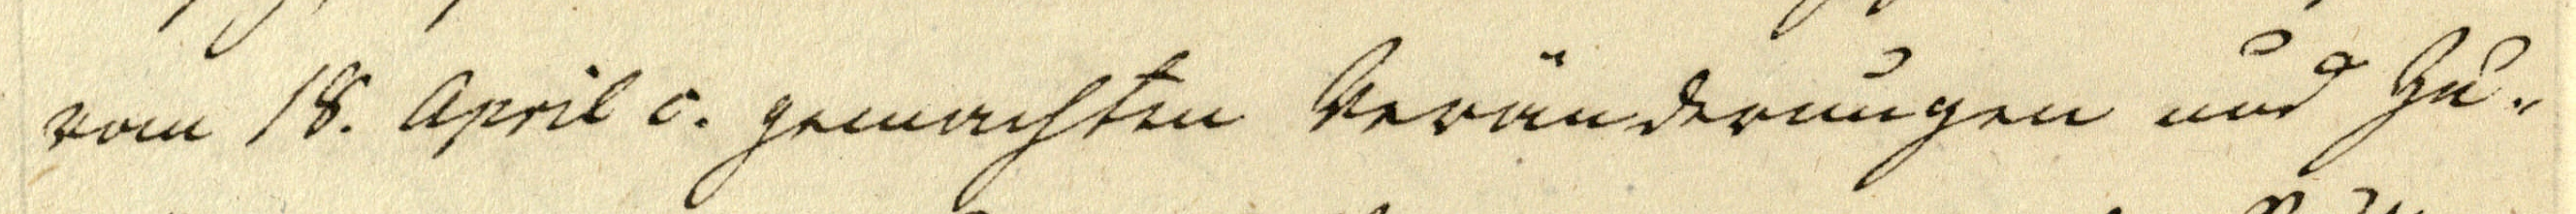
vom 18. April c. gemachten Veränderungen und Zu¬
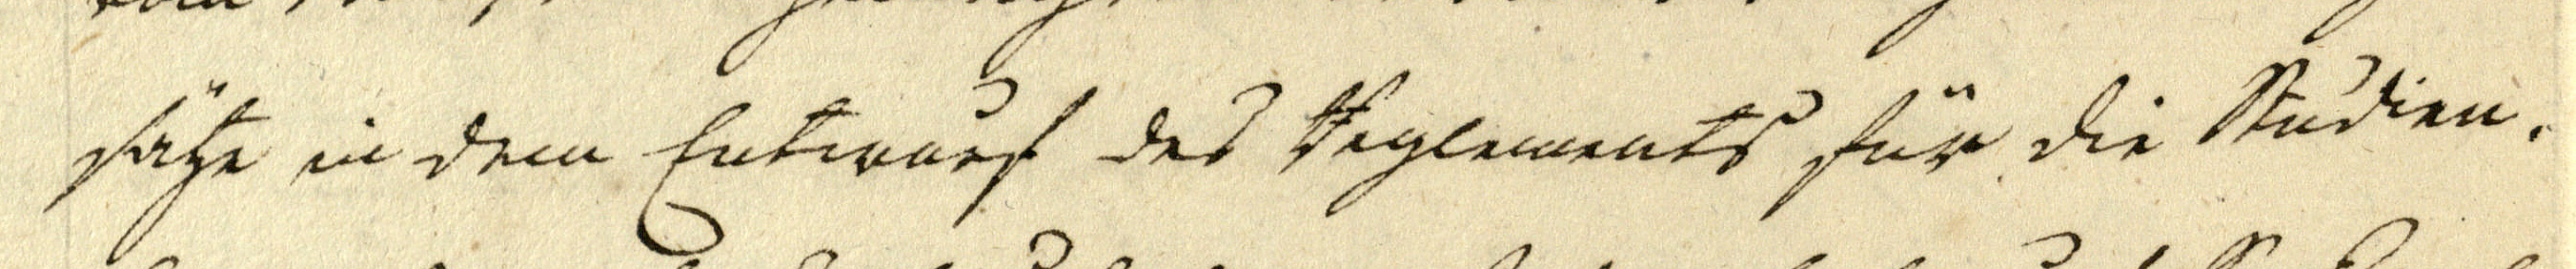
sätze in dem Entwurf des Reglements für die Studien¬
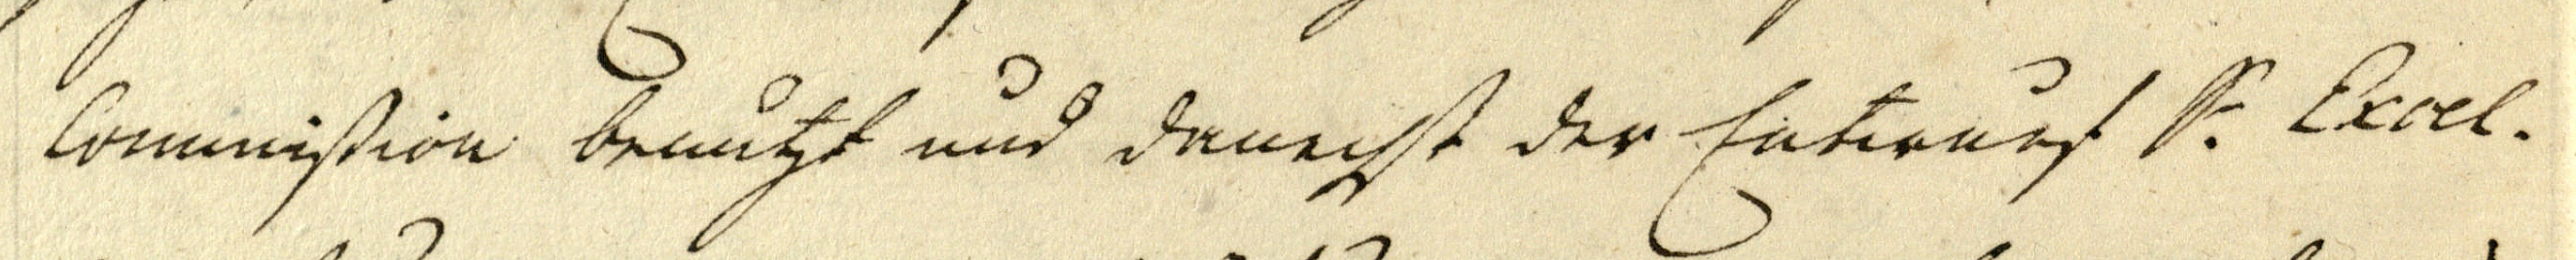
Commission benutzt und danechst der Entwurf Sr. Excel¬
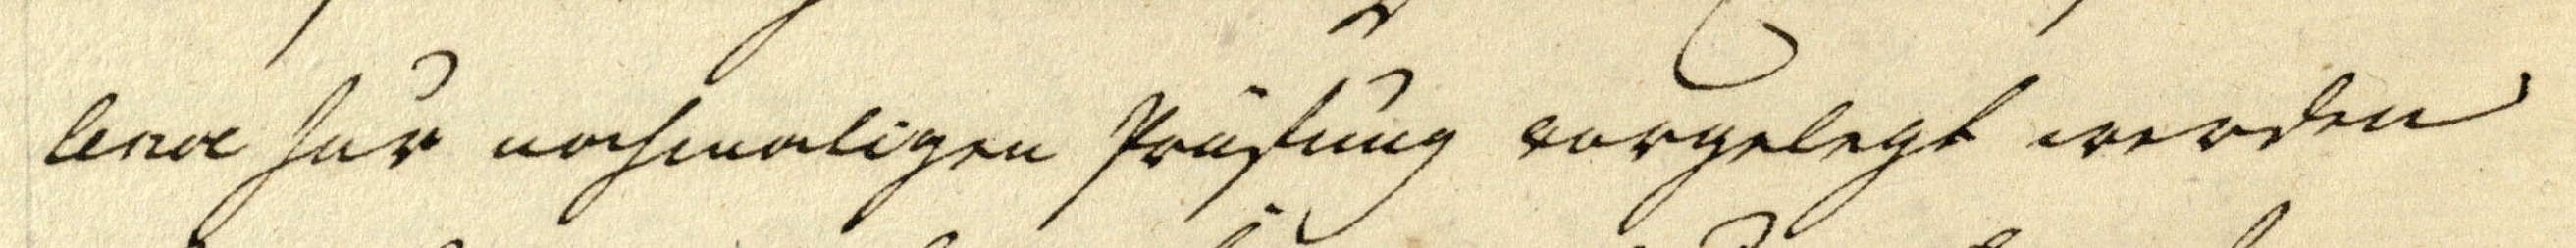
lence zur nochmaligen Prüfung vorgelegt werden
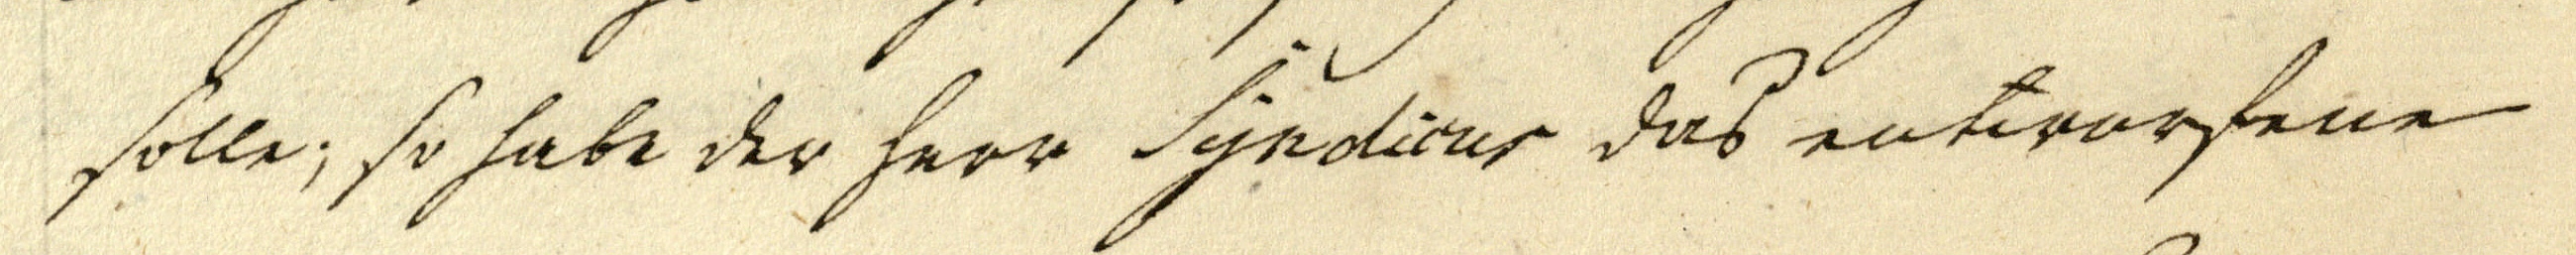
solle; so habe der herr Sÿndicus das entworfene
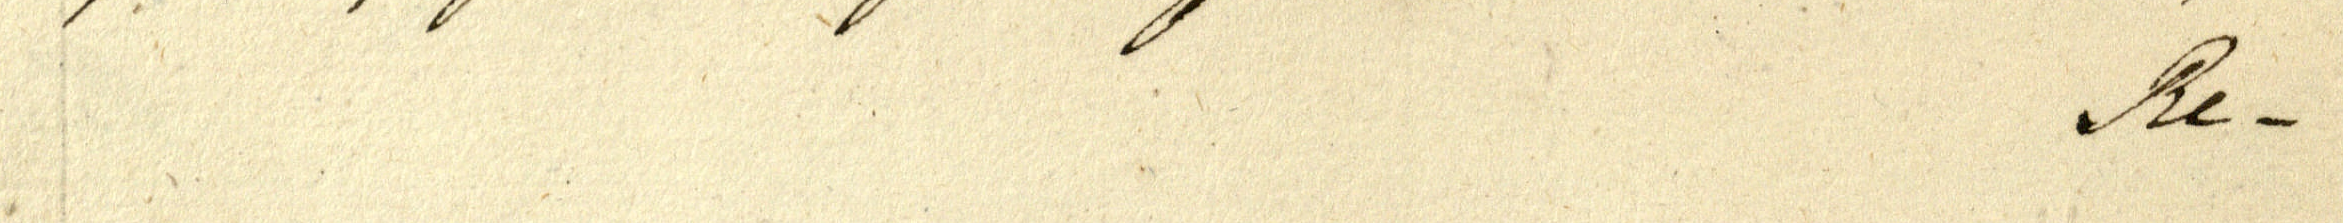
Re
